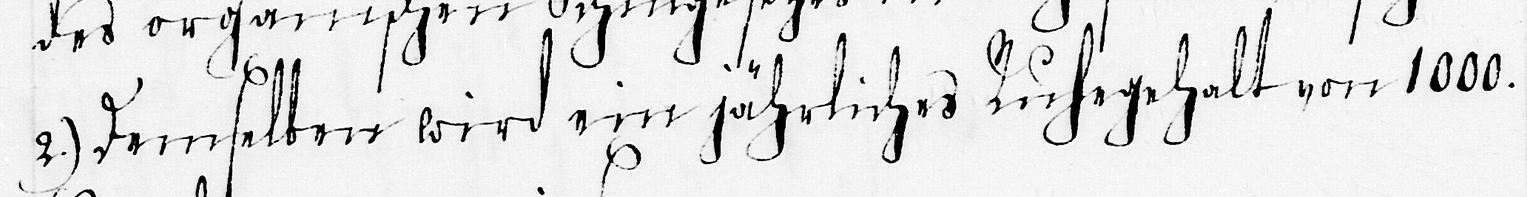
2.) Demselben wird ein jährliches Ruhegehalt von 1000.
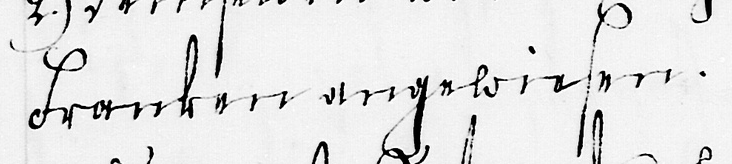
Franken angewiesen.
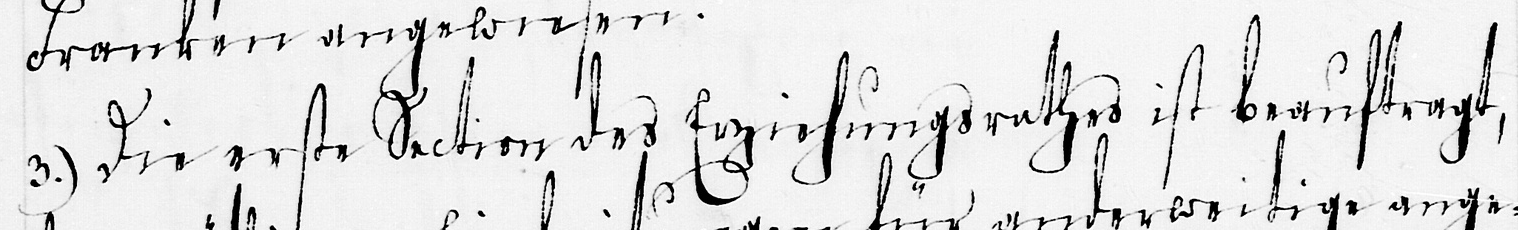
3.) Die erste Section des Erziehungsrathes ist beauftragt,
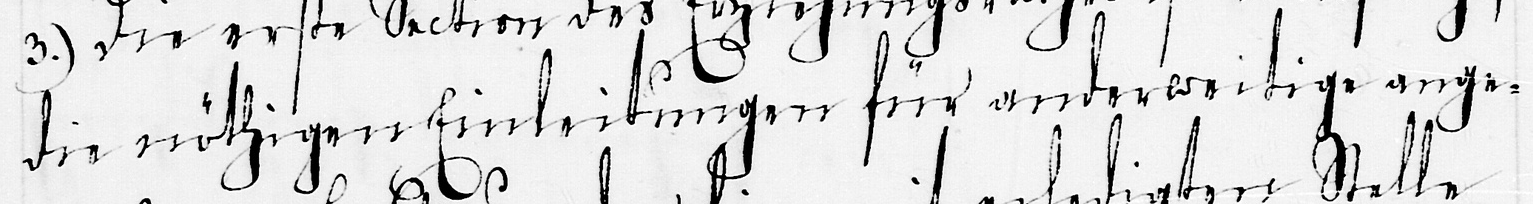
die nöthigen Einleitungen für anderweitige ange¬
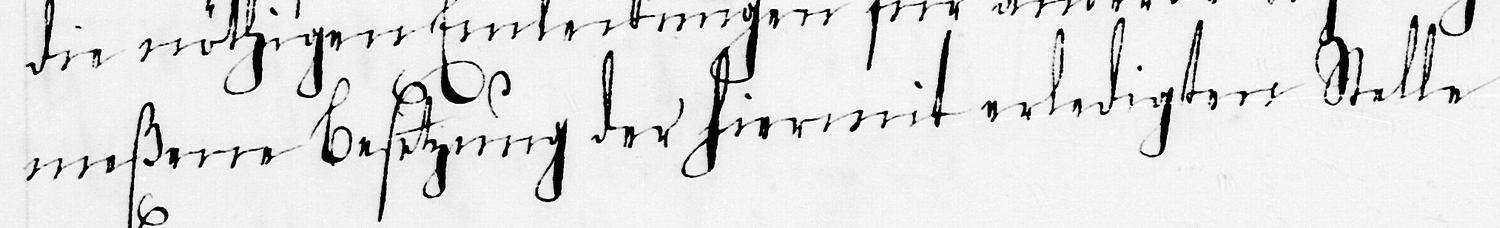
meßene Besetzung der hiermit erledigten Stelle
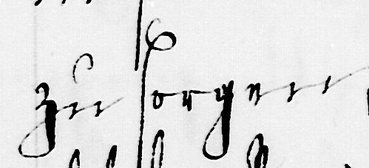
zu sorgen;
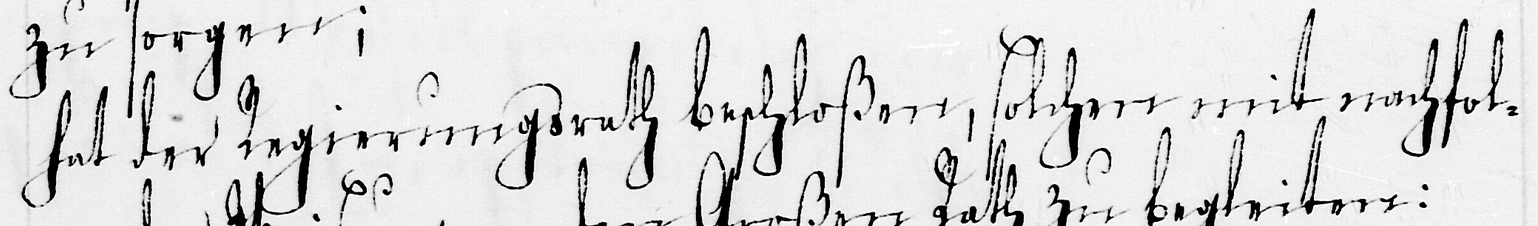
hat der Regierungsrath beschloßen, solchen mit nachfol¬
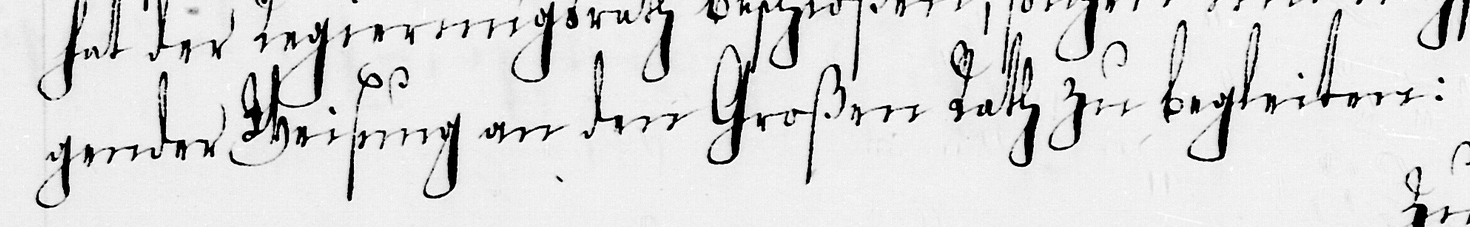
gender Weisung an den Großen Rath zu begleiten:
